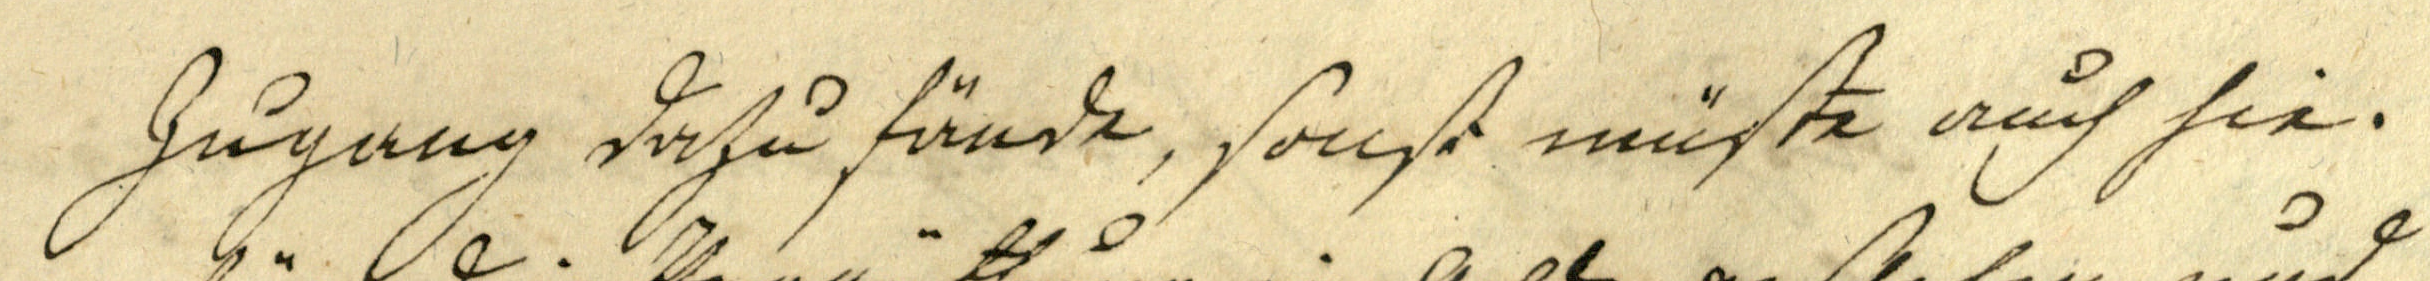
Zugang dazu fände, sonst müsse auch hie¬
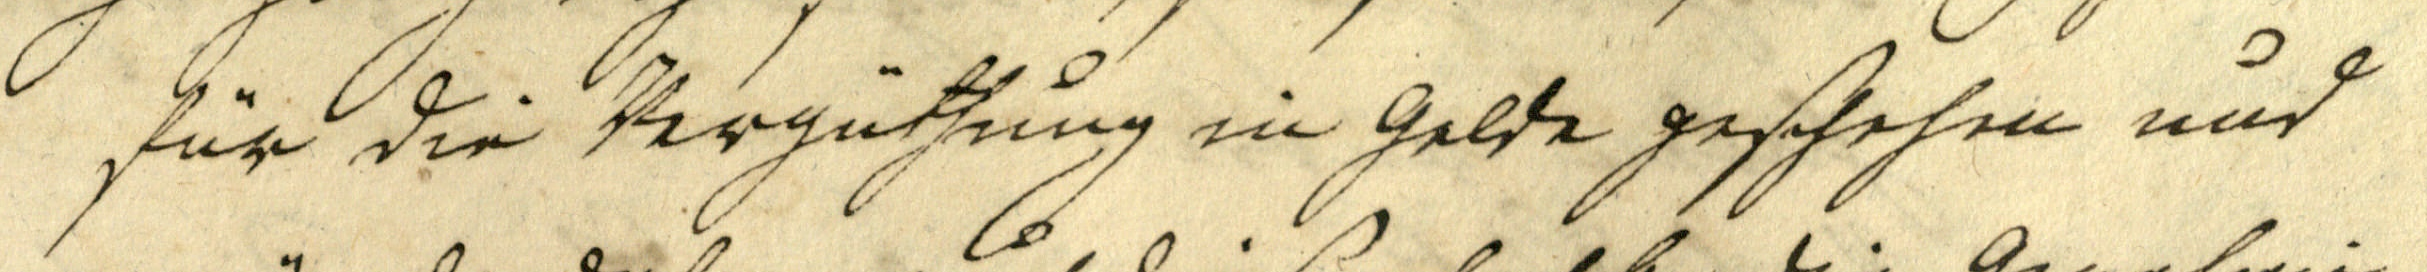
für die Vergüthung in Gelde geschehen und
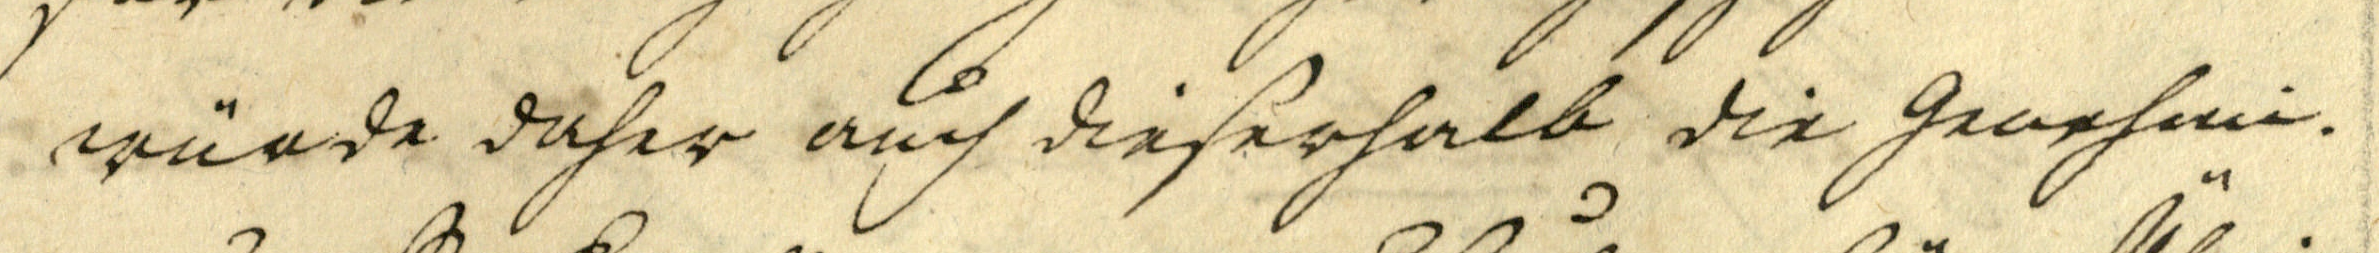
würde daher auch dieserhalb die Genehmi¬
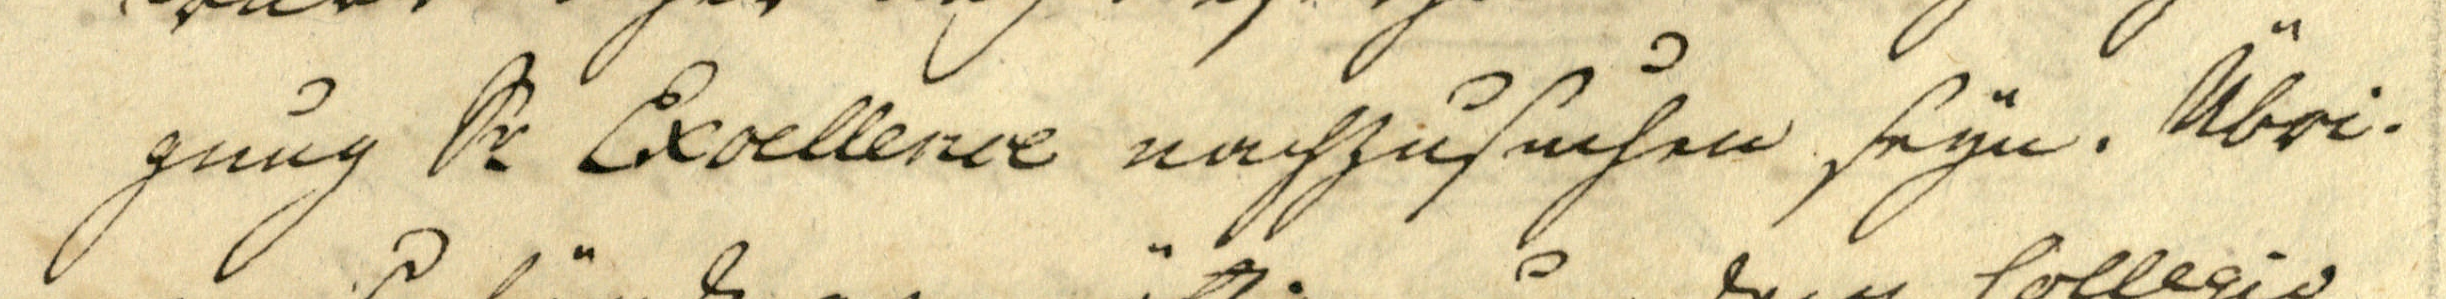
gung Sr Excellence nachzusuchen seÿn. Übri¬
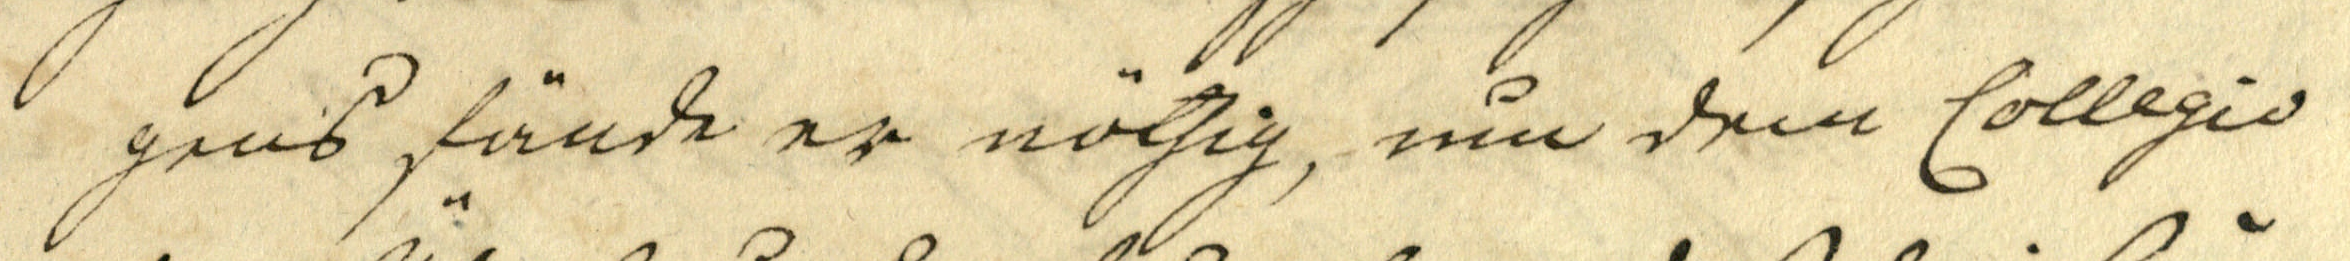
gens fände er nöthig, um dem Collegio
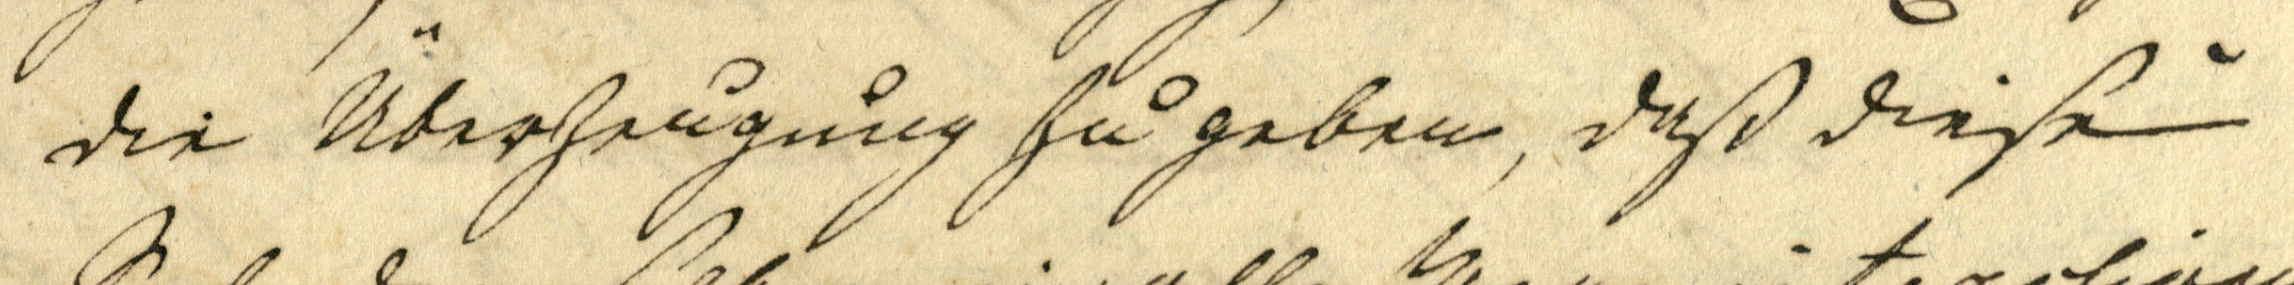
die Überzeugung zu geben, daß diese
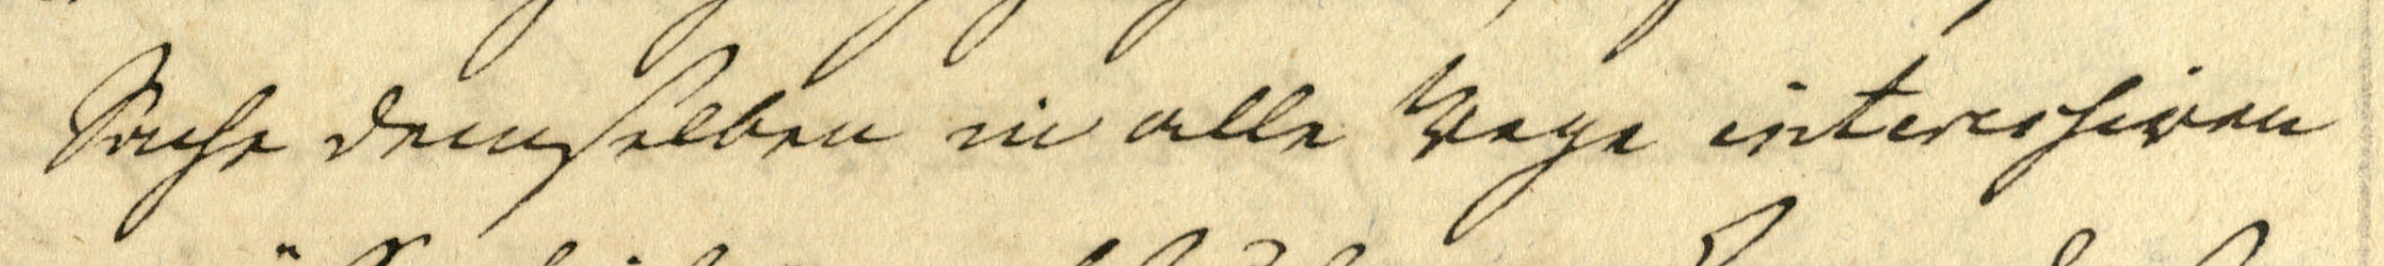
Sache demselben in alle Wege interessiren
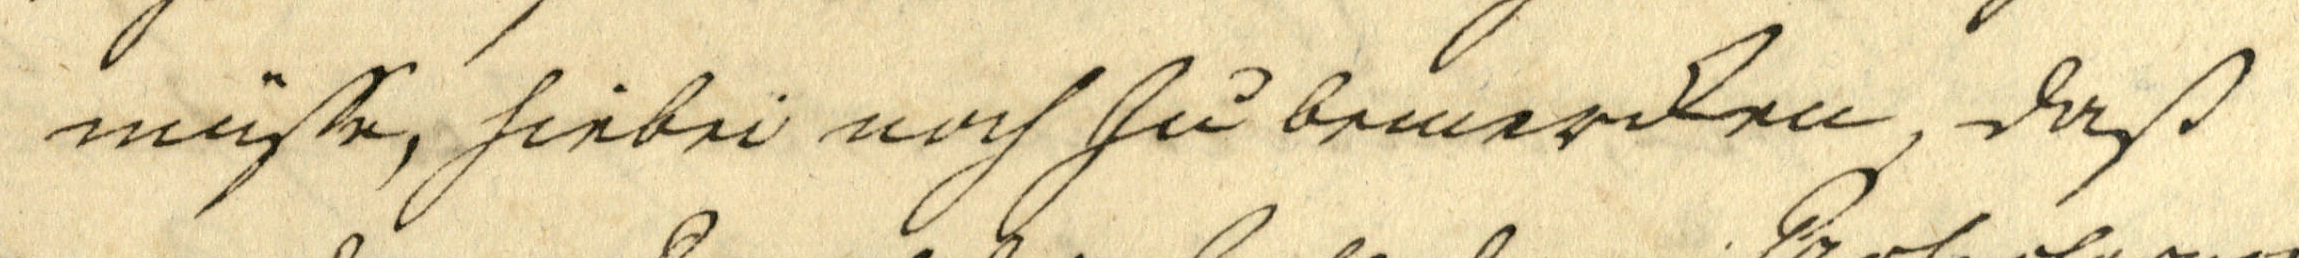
müsse, hiebei noch zu bemercken, daß
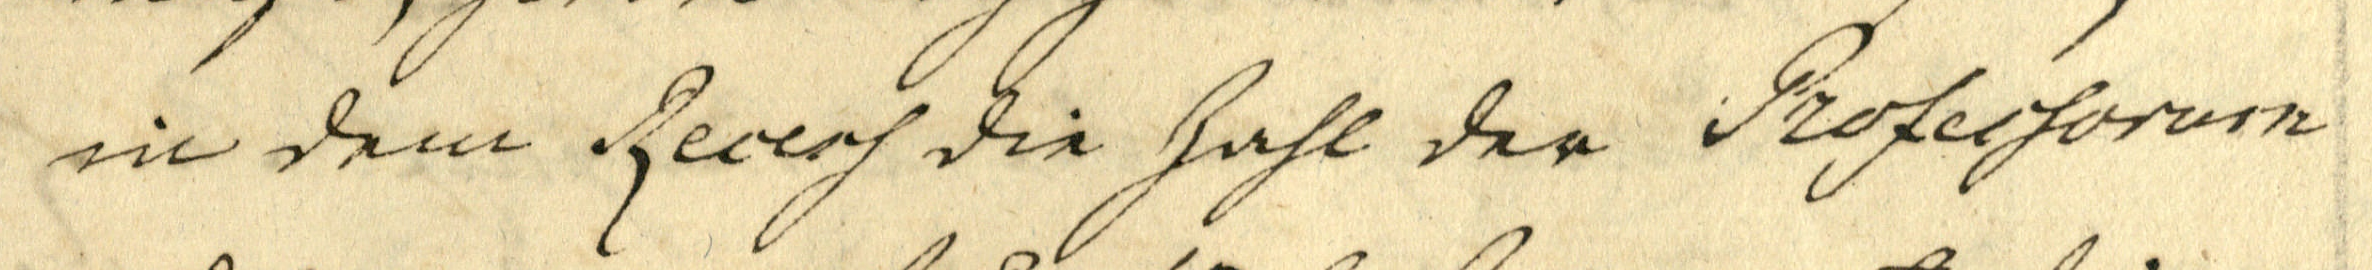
in dem Recess die Zahl der Professorum
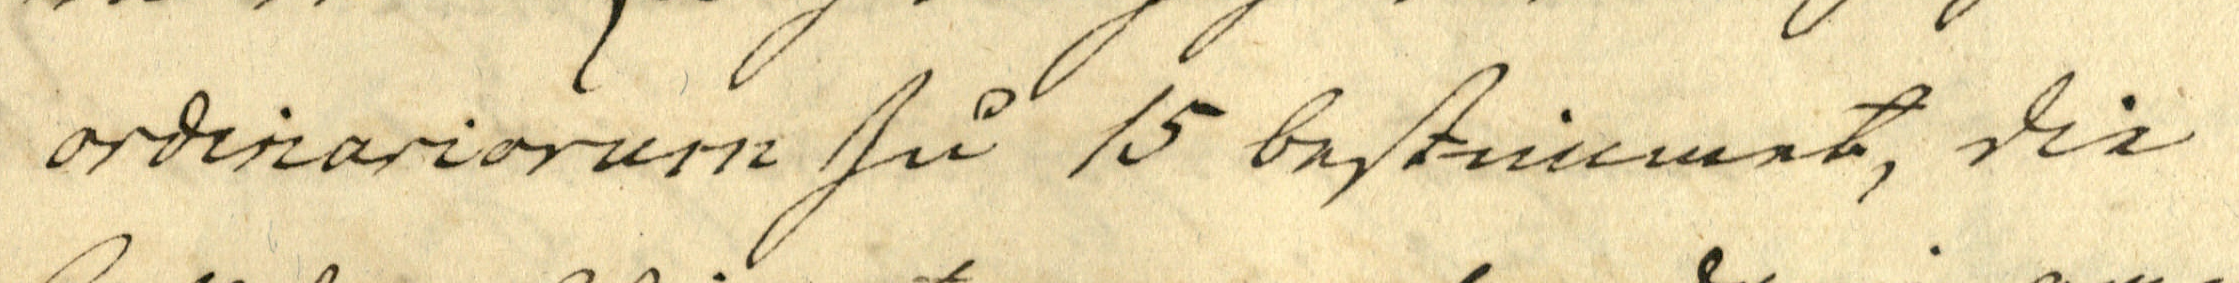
odinariorum zu 15 bestimmet, die
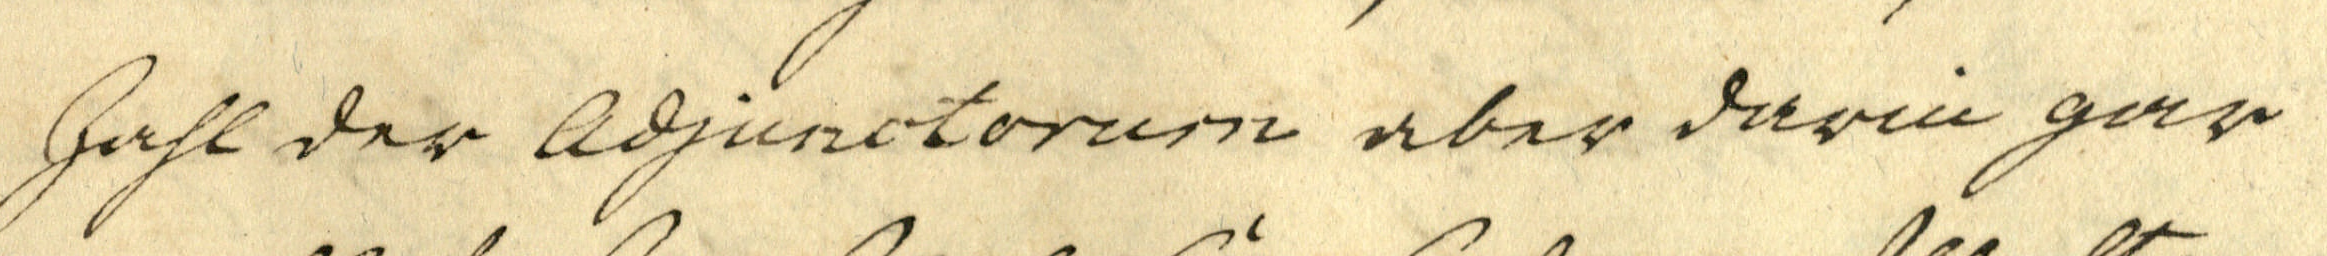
Zahl der Adjunctorum aber darin gar
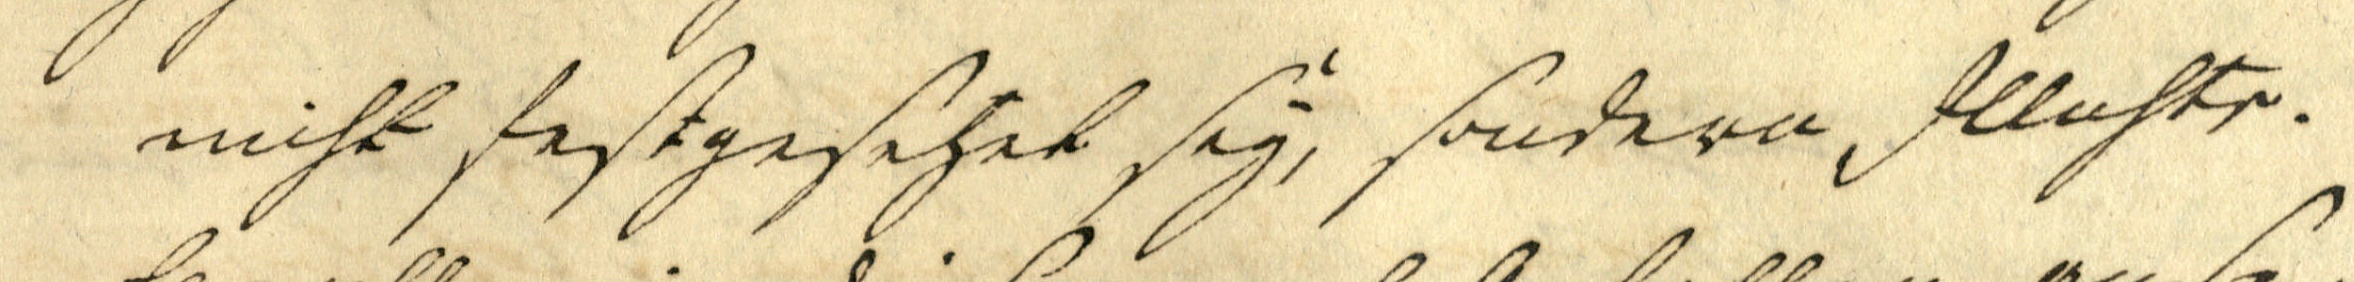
nicht festgesetzet seÿ, sondern Illustr.
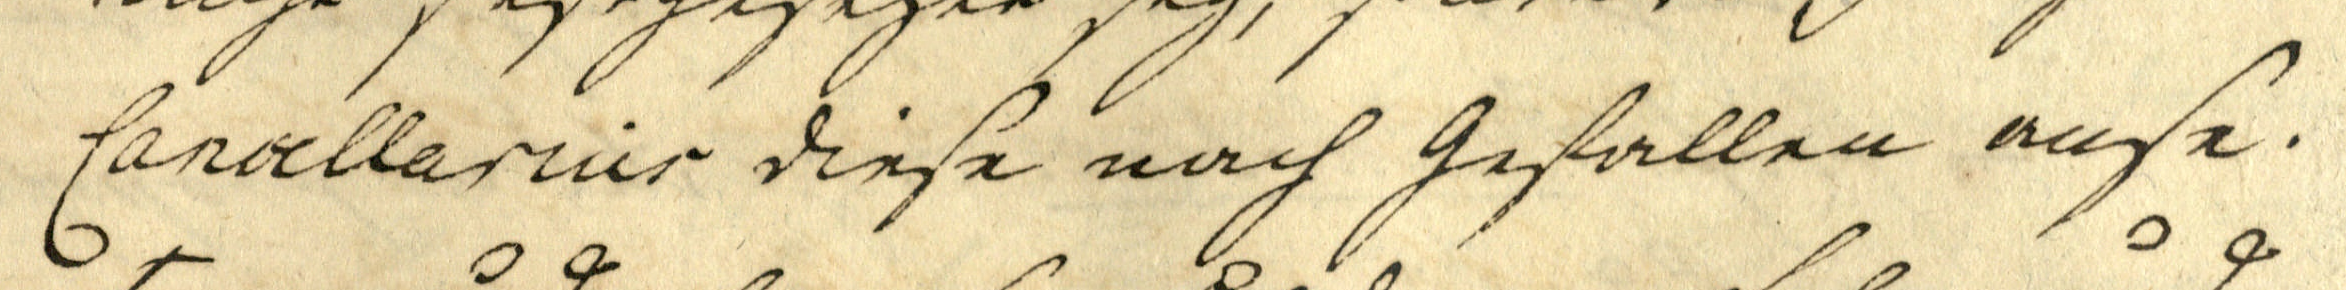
Cancellarius diese nach Gefallen anse¬
